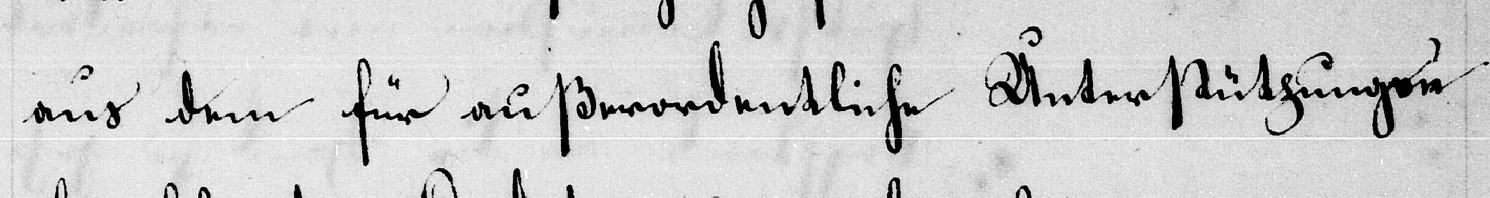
aus dem für außerordentliche Unterstützungen
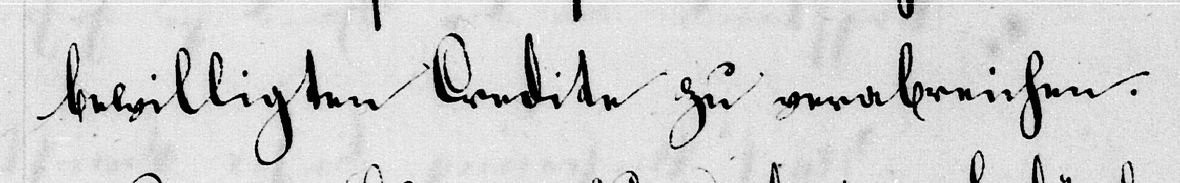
bewilligten Credite zu verabreichen.
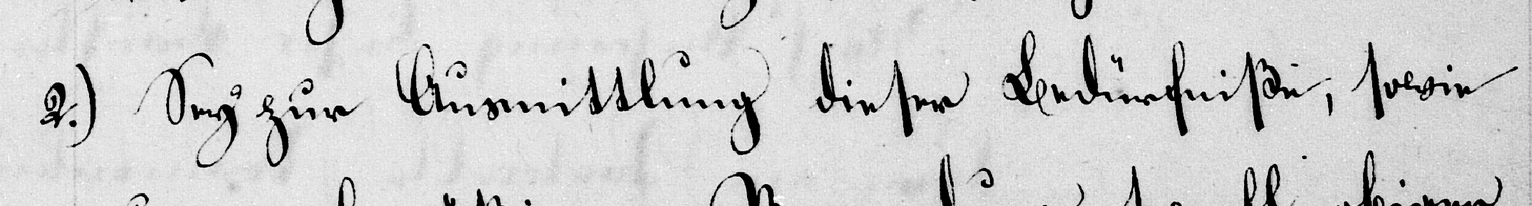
2.) Sey zur Ausmittlung dieser Bedürfniße, sowie
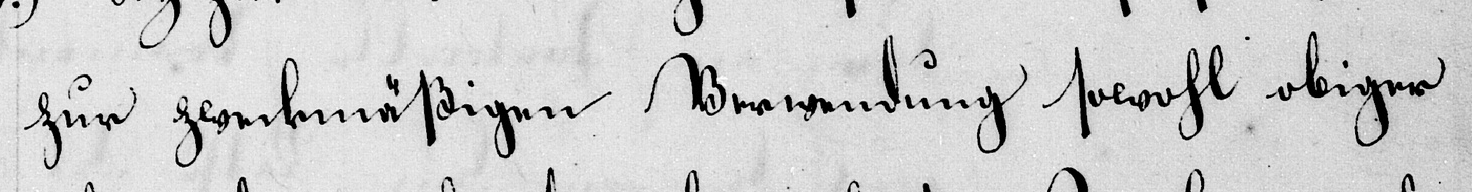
zur zweckmäßigen Verwendung sowohl obiger
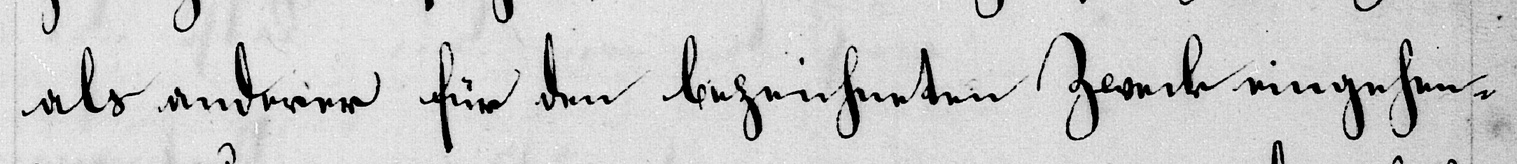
als anderer für den bezeichneten Zweck eingehen¬
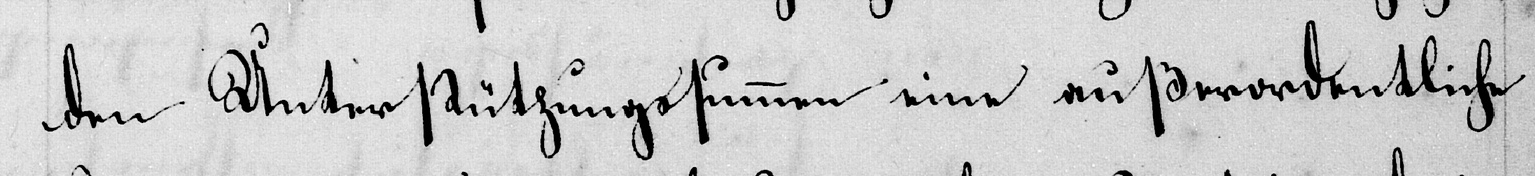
den Unterstützungssummen eine außerordentliche
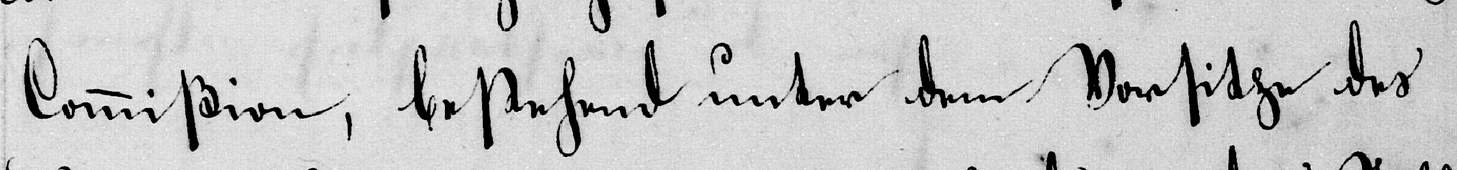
Commißion, bestehend unter dem Vorsitze des
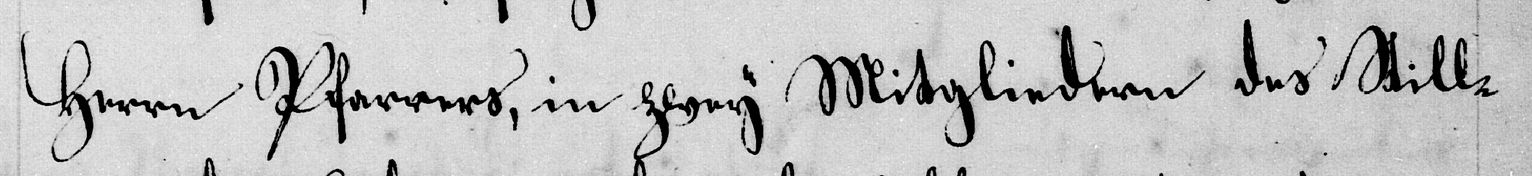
Herrn Pfarrers, in zwey Mitgliedern des Still¬
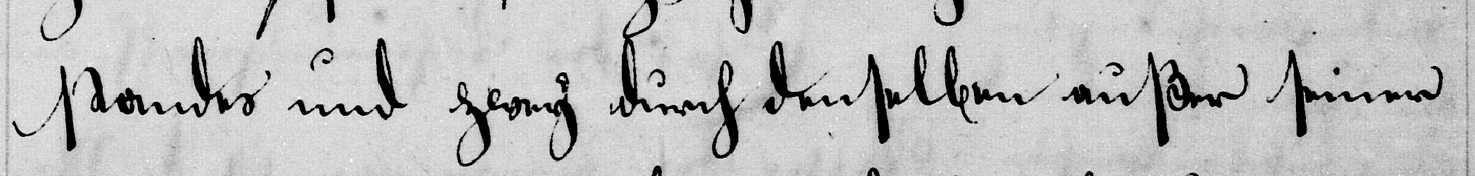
standes und zwey durch denselben außer seiner
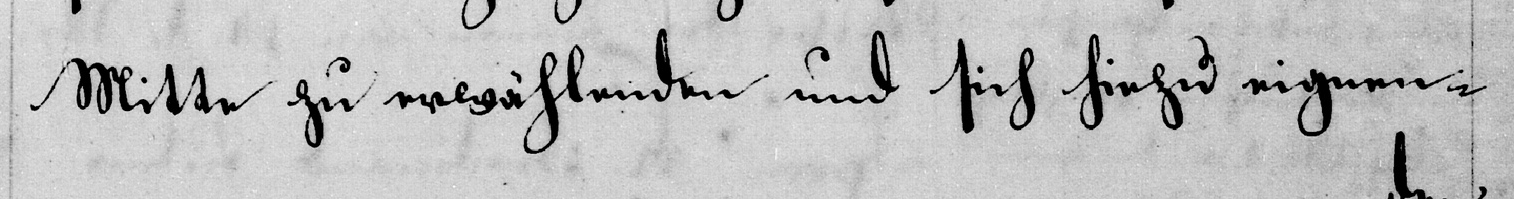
Mitte zu erwählenden und sich hiezu eignen-
